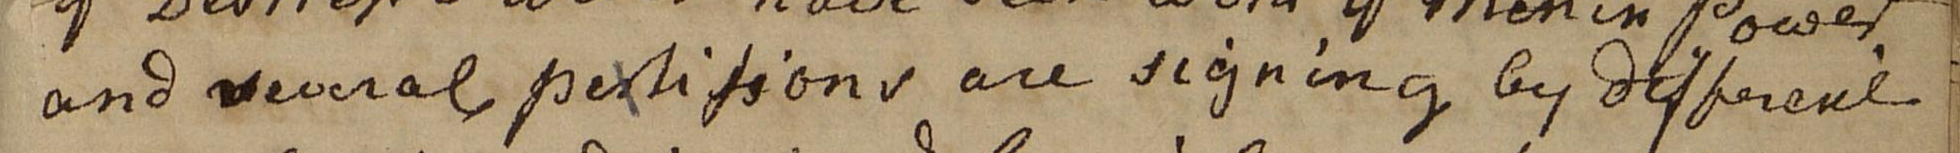and several pertisions are signing by different
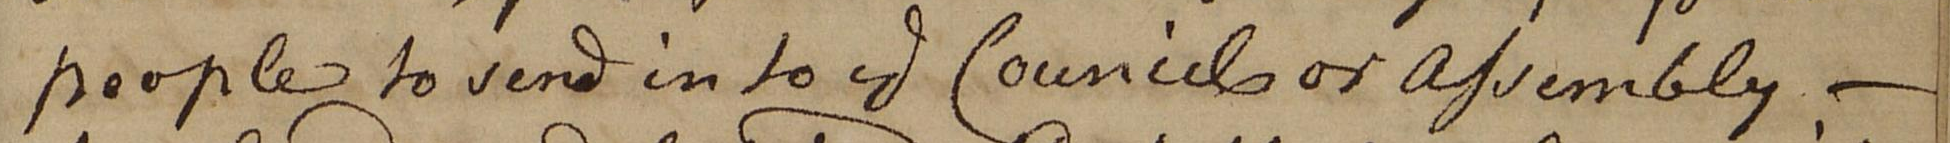people to send in to y^e Council or Assembly-
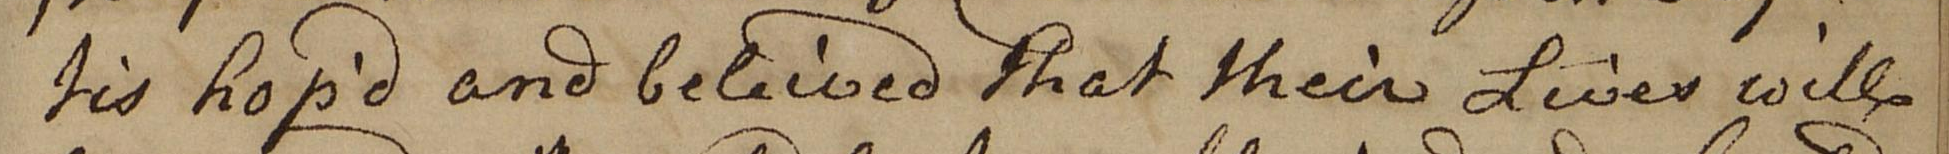tis hop'd and beleived that their Lives will
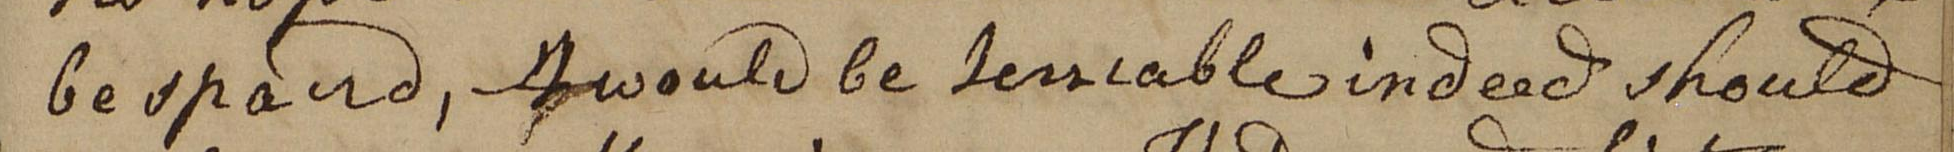be spard, it would be terriable indeed should
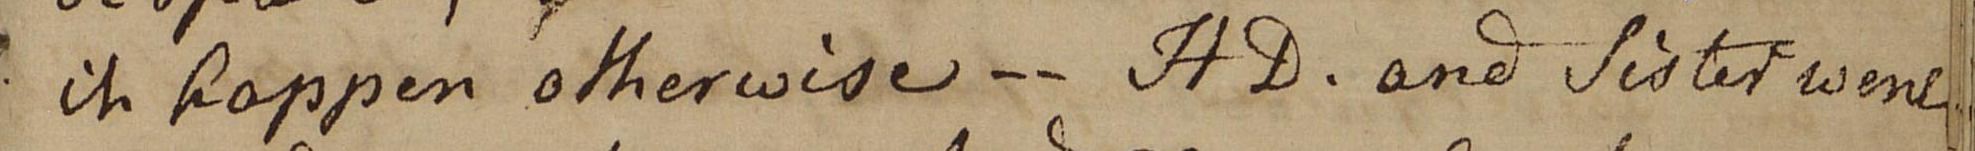it happen otherwise-- H D. and Sister went
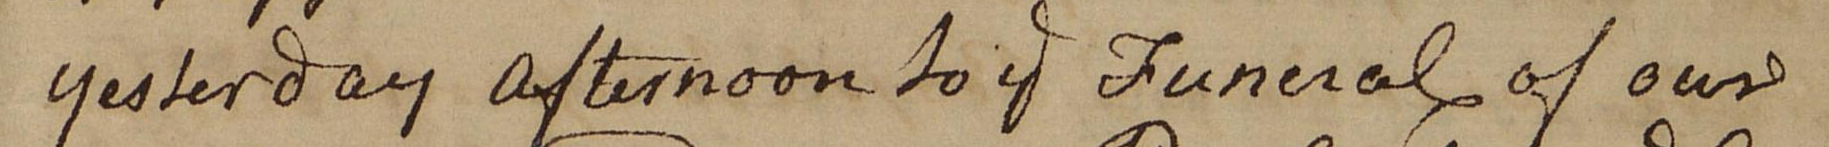Yesterday Afternoon to y^e Funeral of our
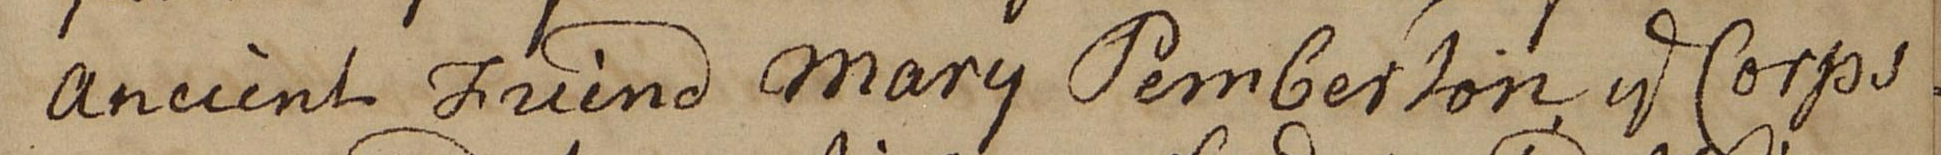Ancient Friend Mary Pemberton y^e Corps
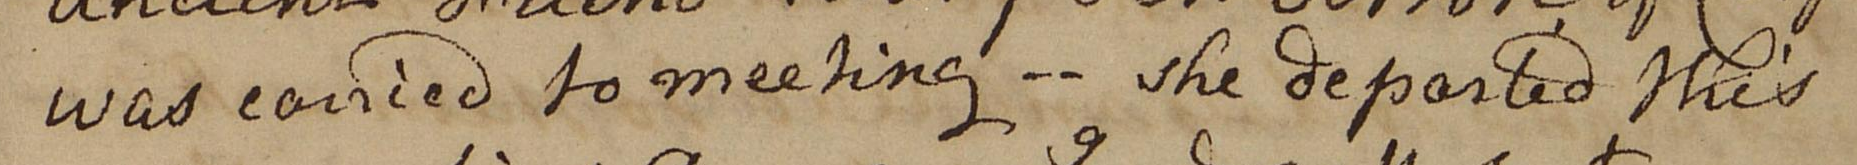was carried to meeting- she departed this
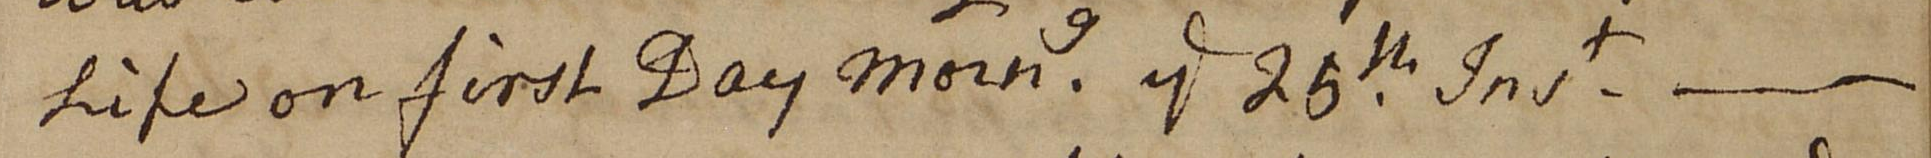Life on first Day morn^g. y^e 25^th. Ins^t.-
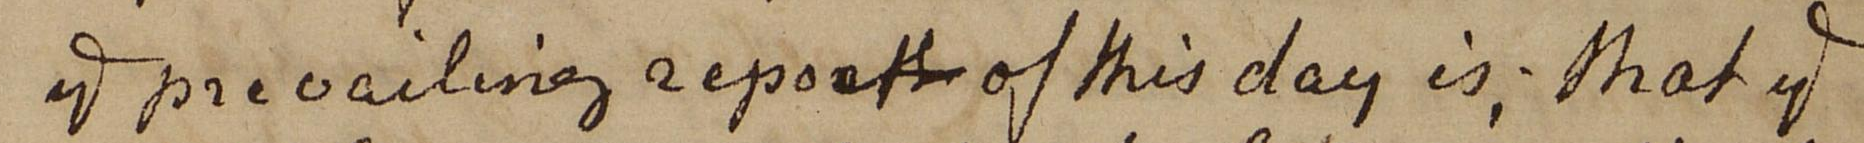y^e prevailing reports of this day is; that y^e
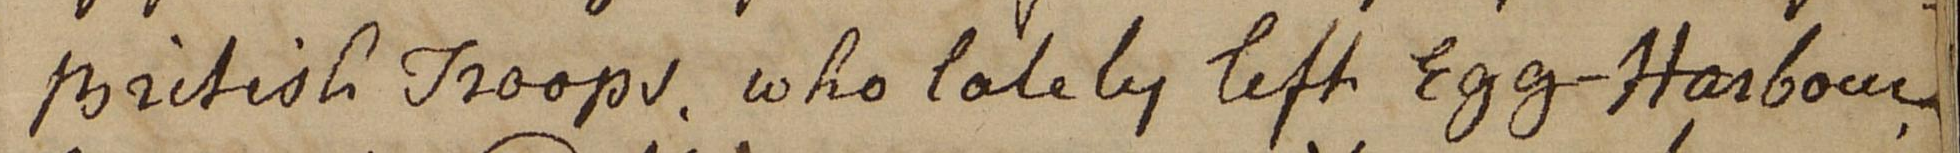British Troops, who lately left Egg Harbour
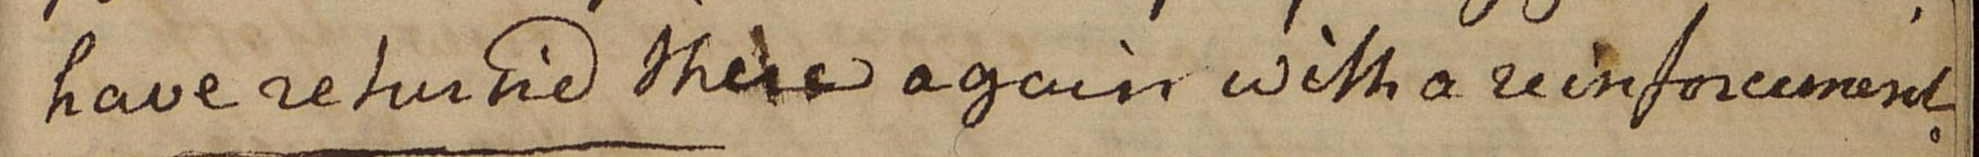have return'd there again with a reinforcement.
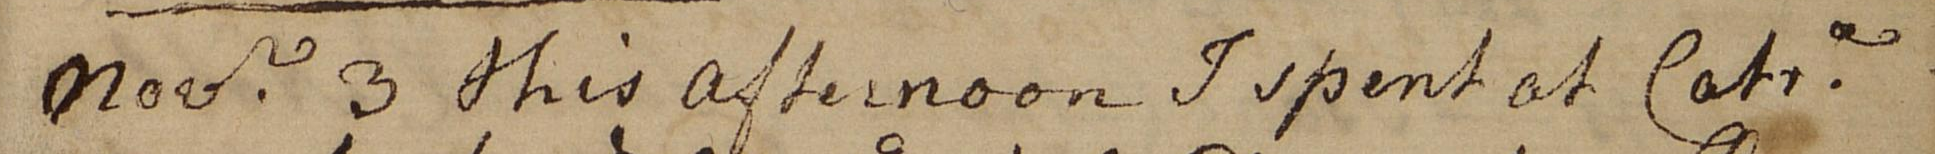Nov^r. 3 this afternoon I spent at Catr^a.
